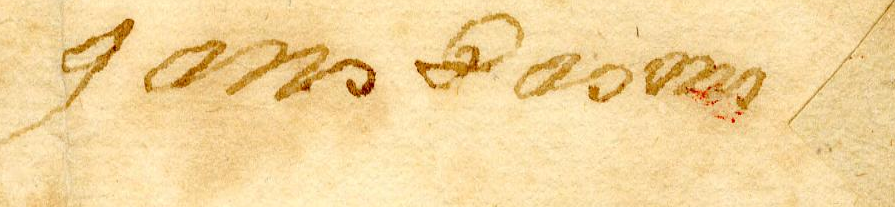James Parsons
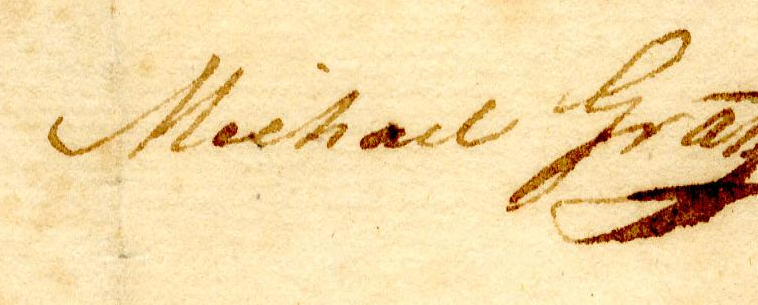Michael Gratz
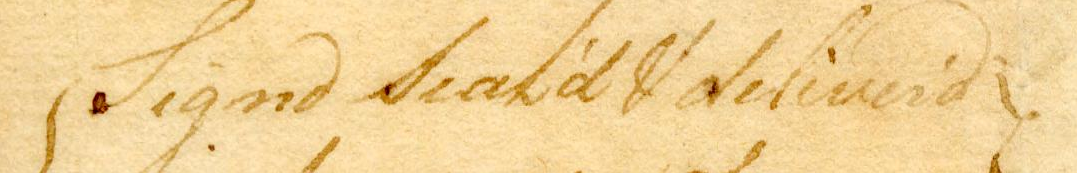Signd Seal'd & deliver'd
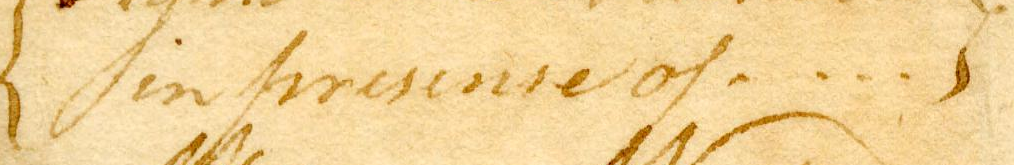in presence of...
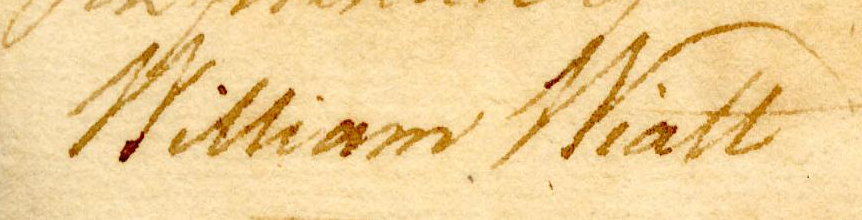William Wiatt
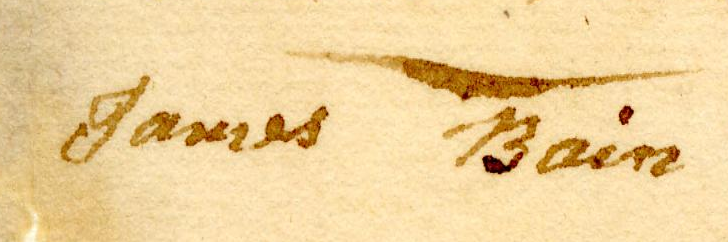James Bain
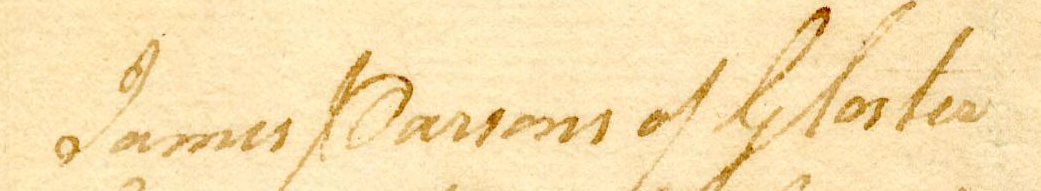Jamis Parsons of Gloster
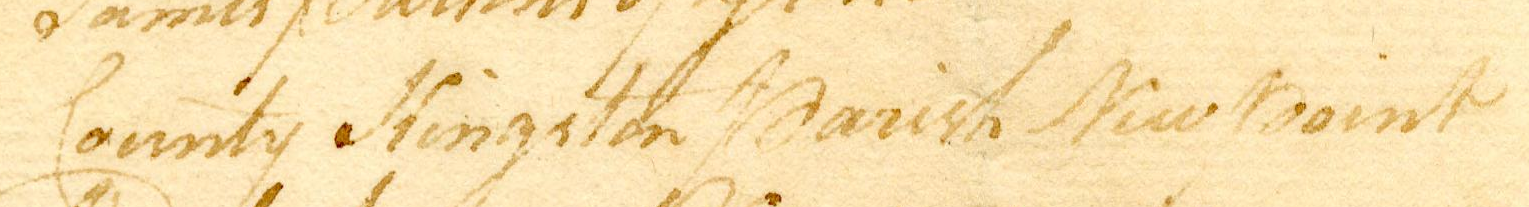County Kingston Parish New Point
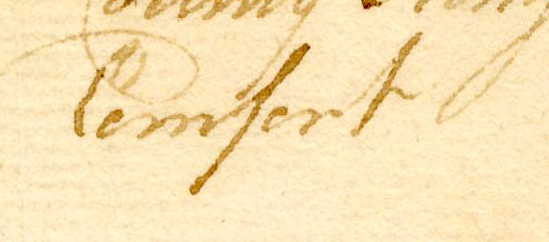Comfort
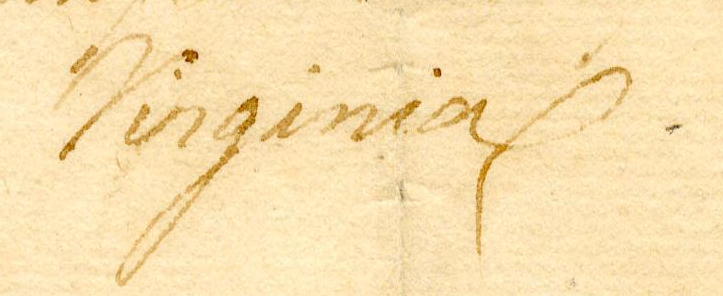Virginia
